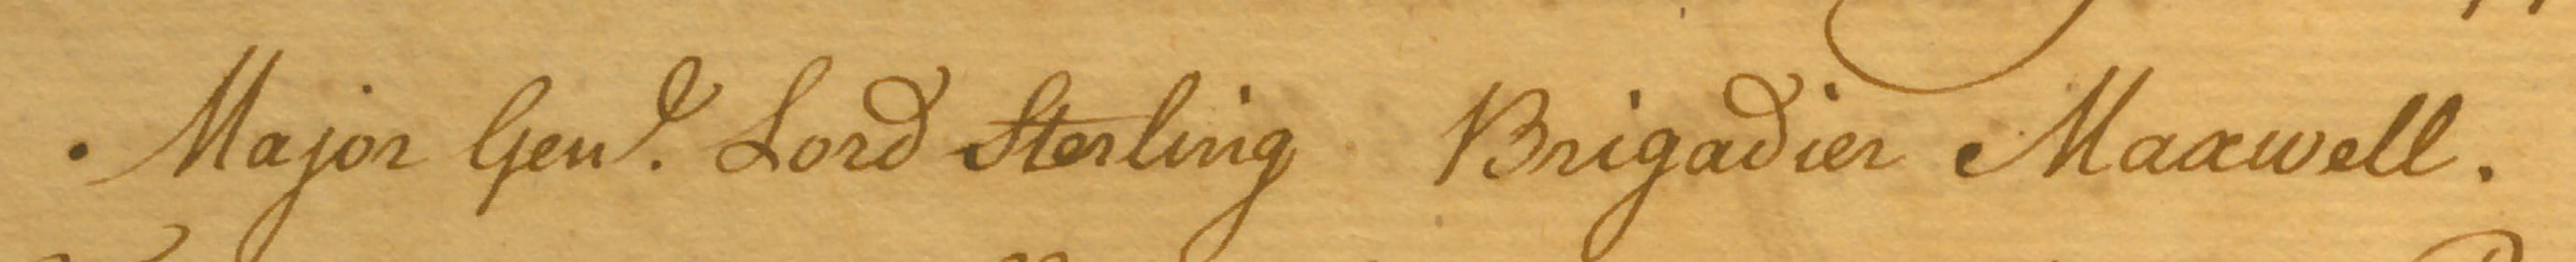Major Gen^l. Lord Sterling Brigadier Maxwell.
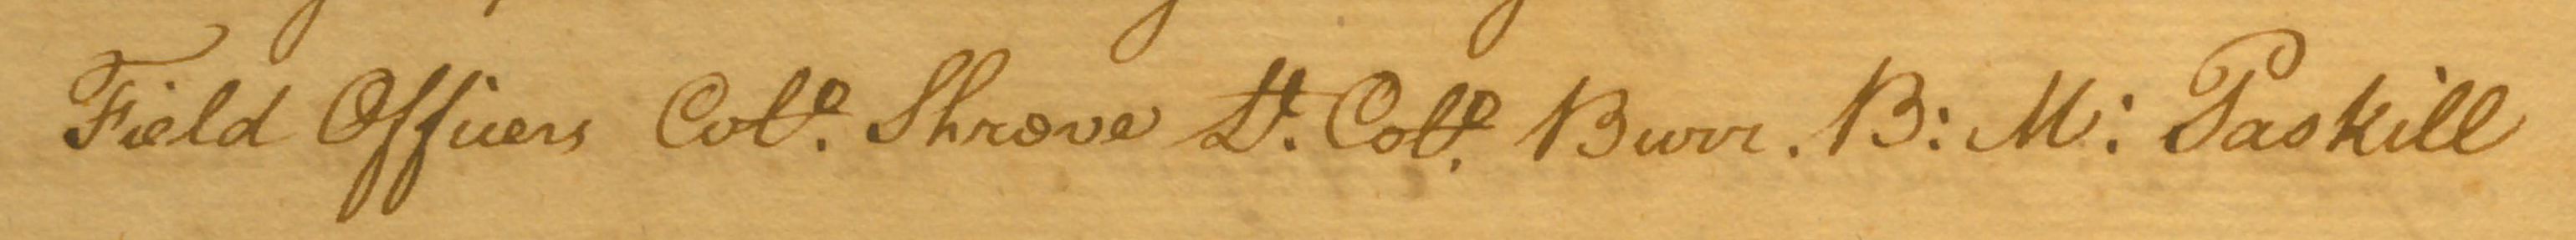Field Officers Col^o. Shreve L^t. Col^o. Burr. B: M: Paskill
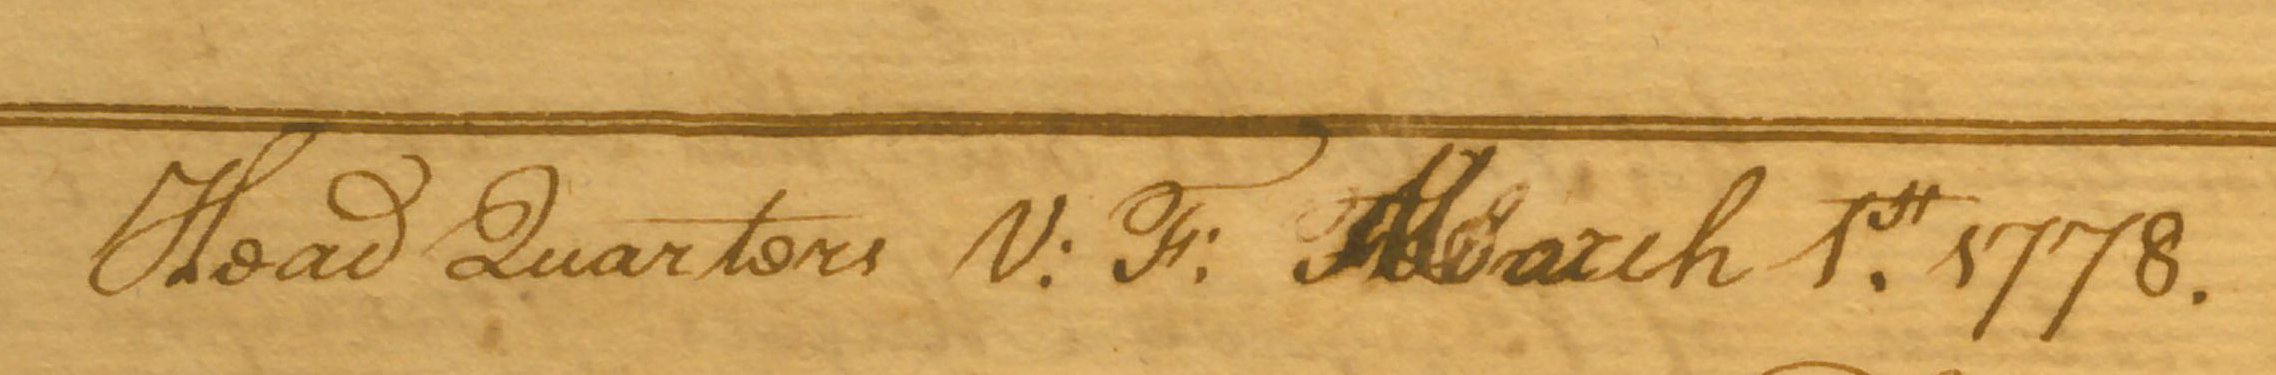Head Quarters V: F: March 1^st. 1778.
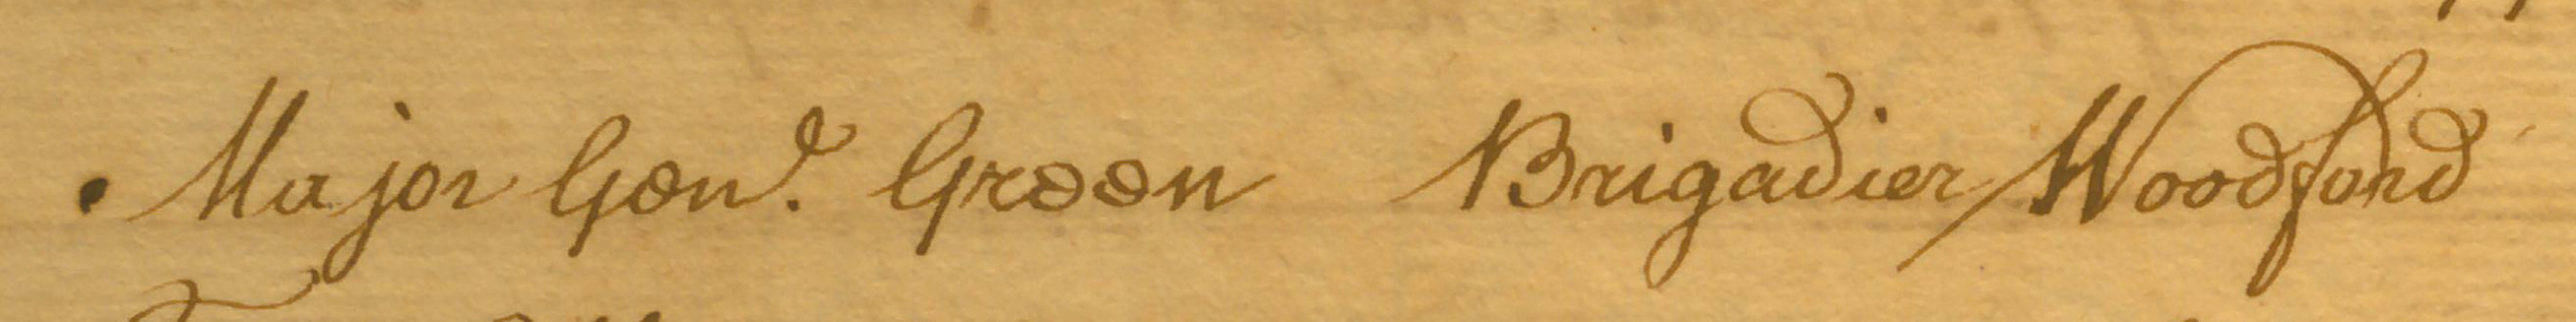Major Gen^l. Green Brigadier Woodford
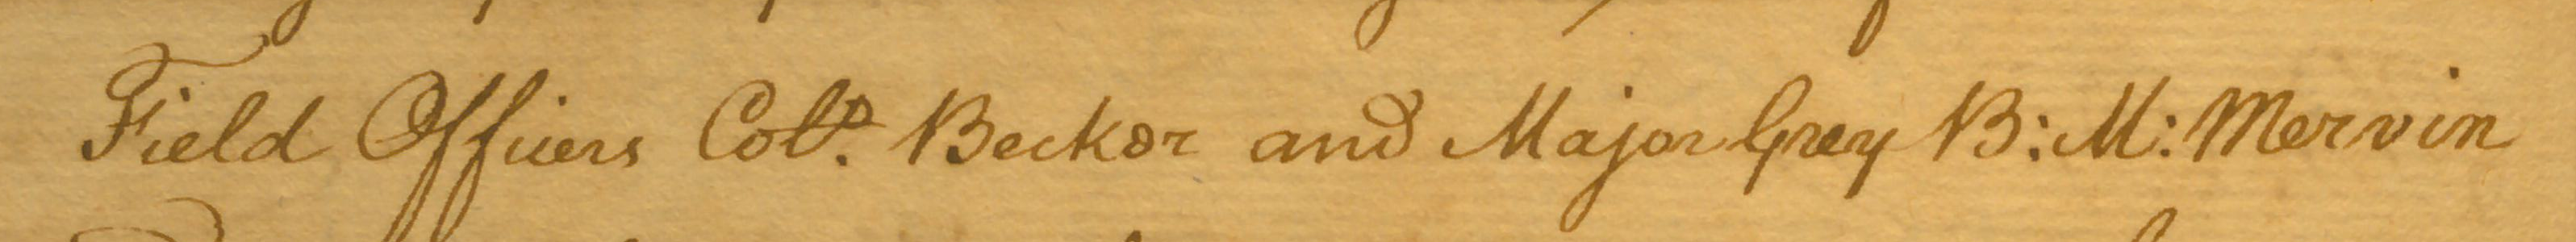Field Officers Col^o. Becker and Major Grey B: M: Mervin
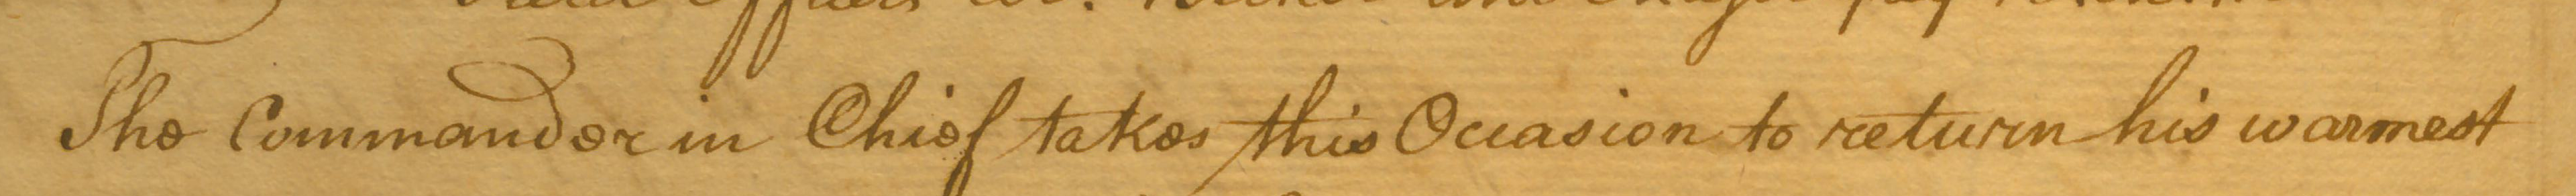The Commander in Chief takes this Occasion to return his warmest
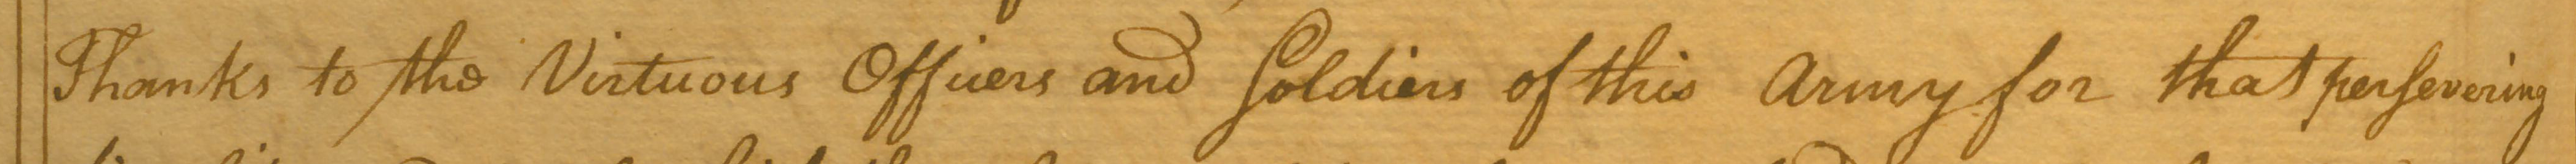Thanks to the Virtuous Officers and soldiers of this Army for that persevering
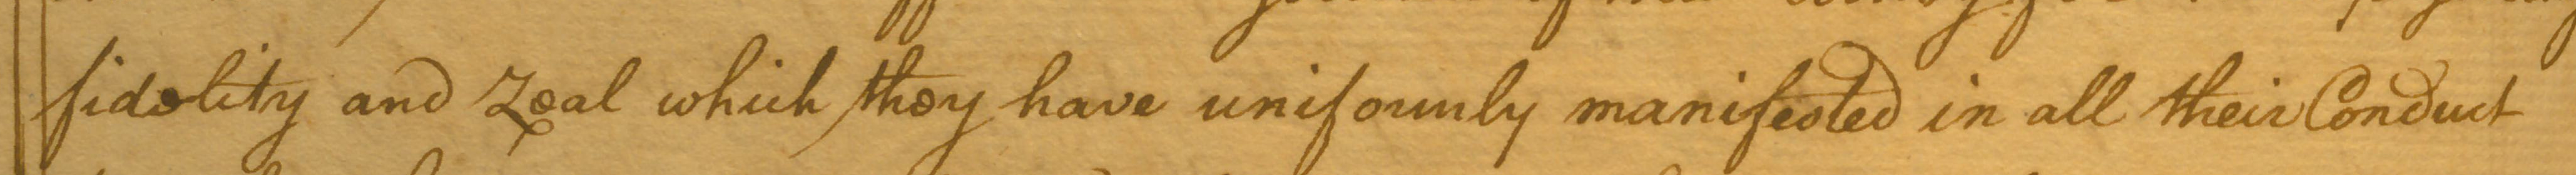fidelity and zeal which they have uniformly manifested in all their Conduct
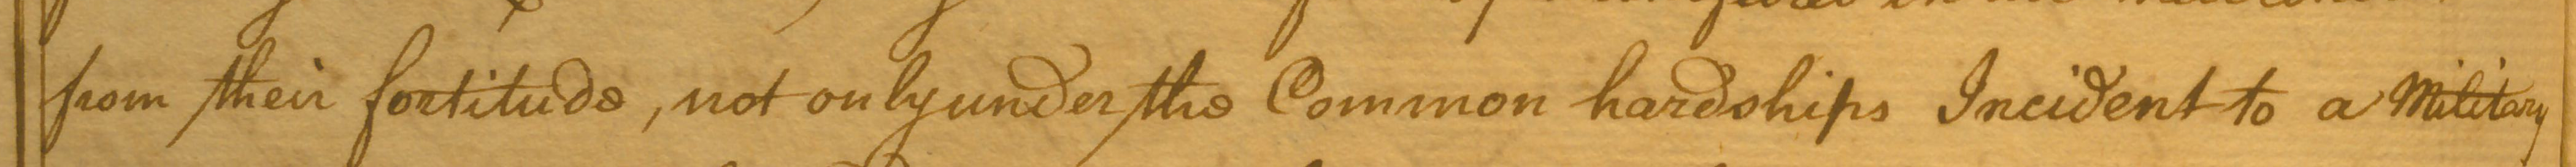from their fortitude, not only under the Common hardships Incident to a Military
